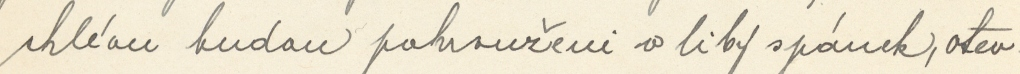chlévu budou pohrouženi v libý spánek, otev-
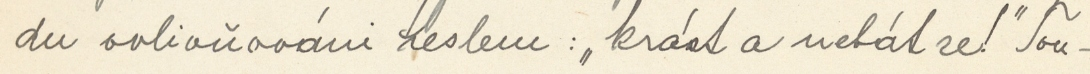du ovlivňováni heslem: „krást a nebát se!“ Tou-
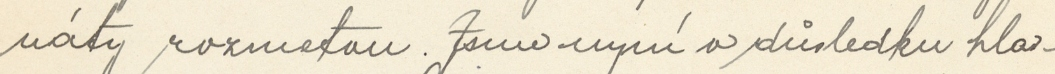náty rozmetou. Jsme nyní v důsledku hla-
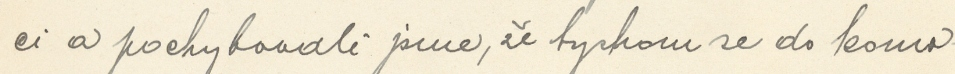ci a pochybovali jsme, že bychom se do komo-
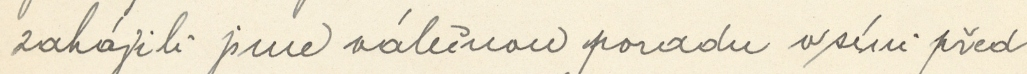zahájili jsme válečnou poradu v síni před
